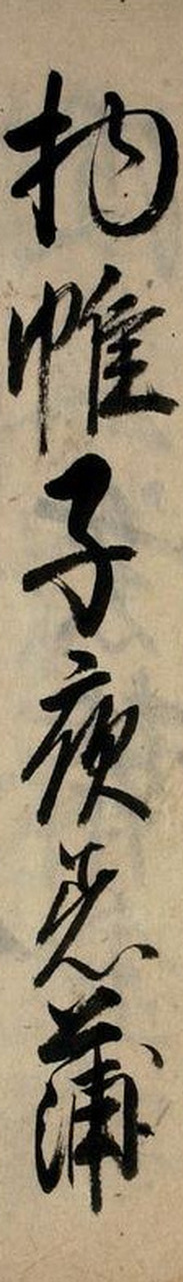物帷子夜着蒲
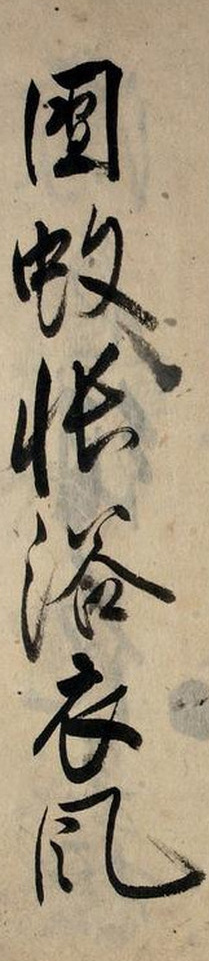団蚊帳浴衣風
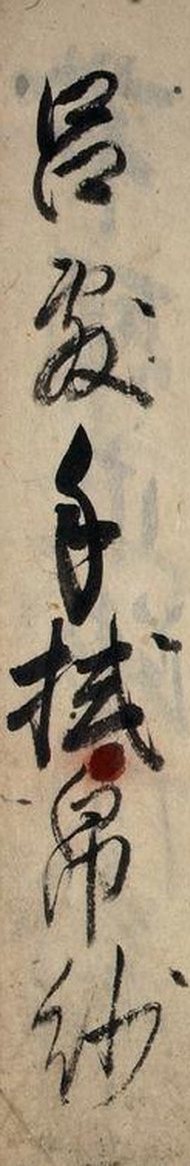呂敷手拭帛紗

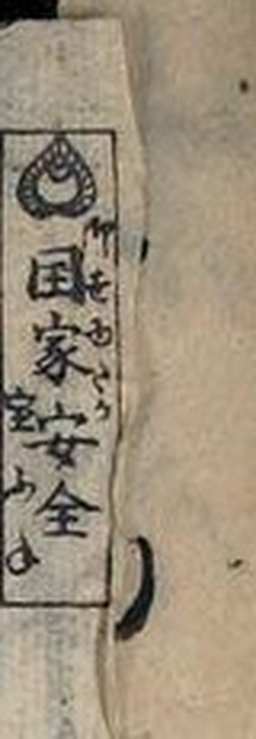国歌安全
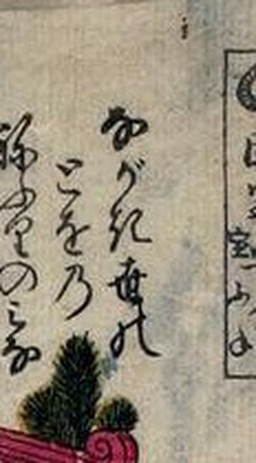ながき世の
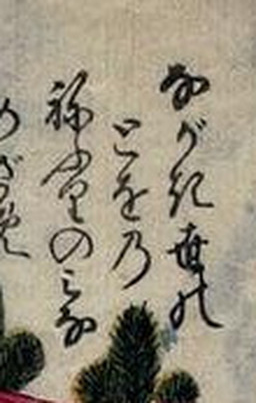とをの
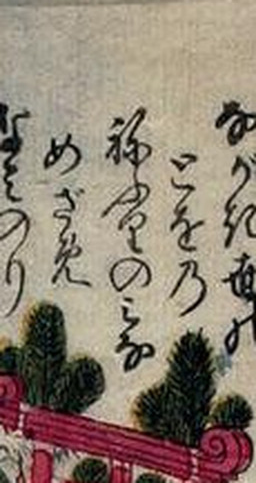ねふりのみな
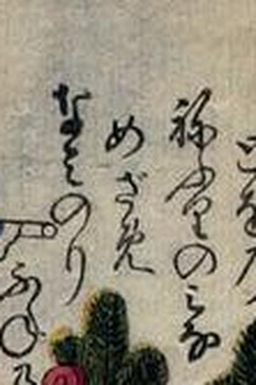めざめ
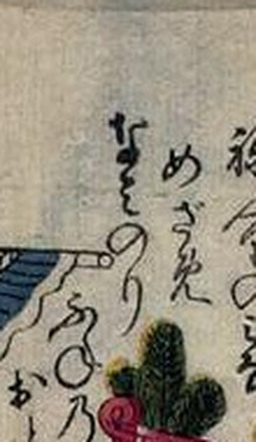なみのり
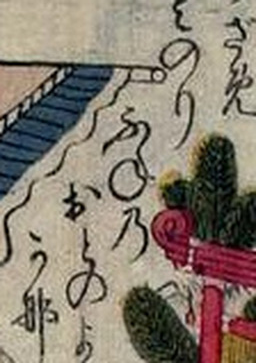ふねの
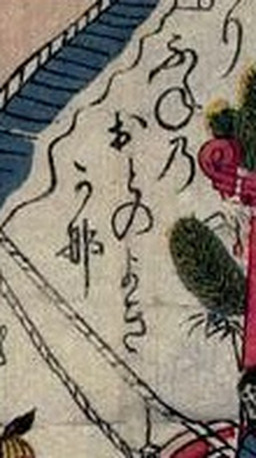おとのよき

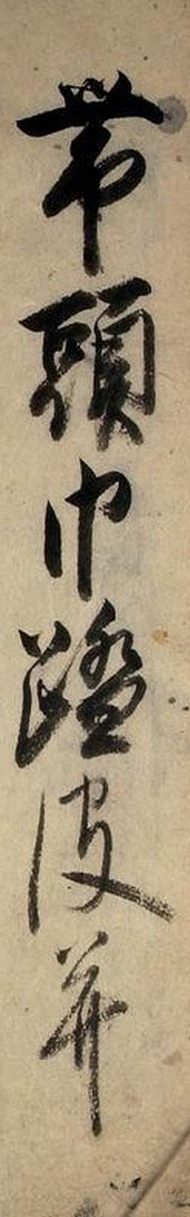帯頭巾踏皮幷
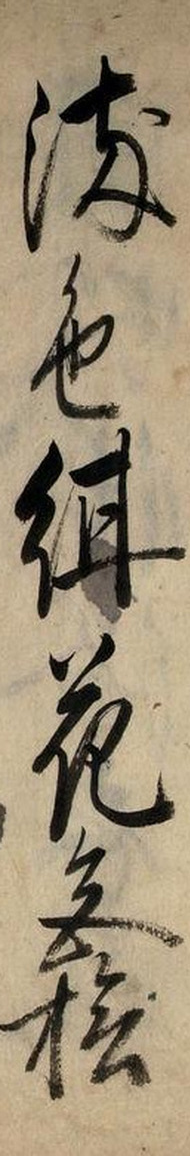染色紺花色檜
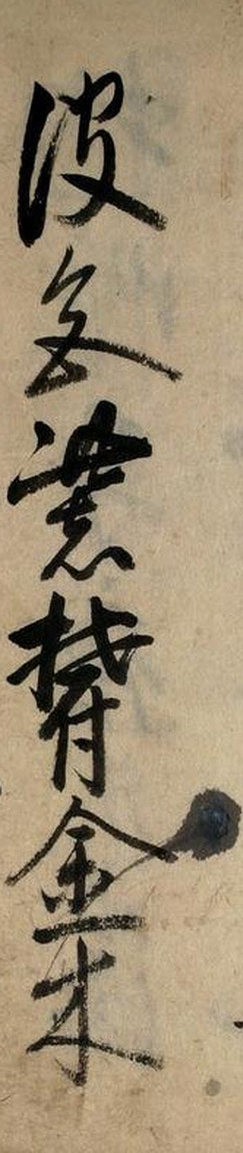皮色紫鬱金木
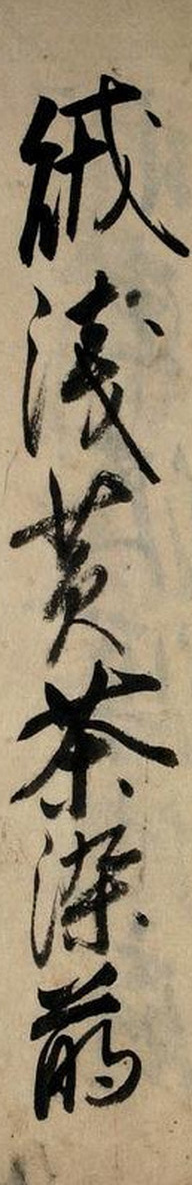賊浅黄茶染萌
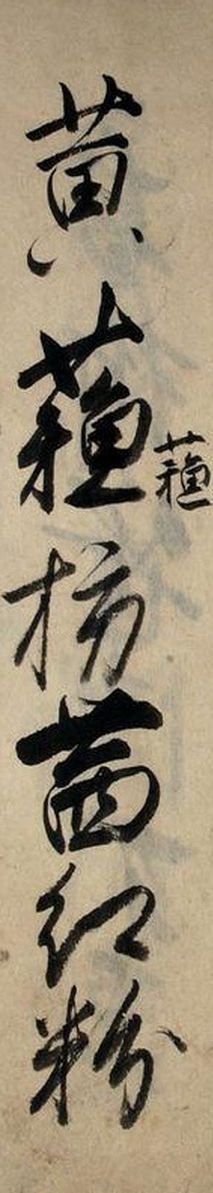黄蘇枋茜紅粉
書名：商売往来（往来物、手習手本）
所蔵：福井県文書館 Fukui Prefectural Archives
